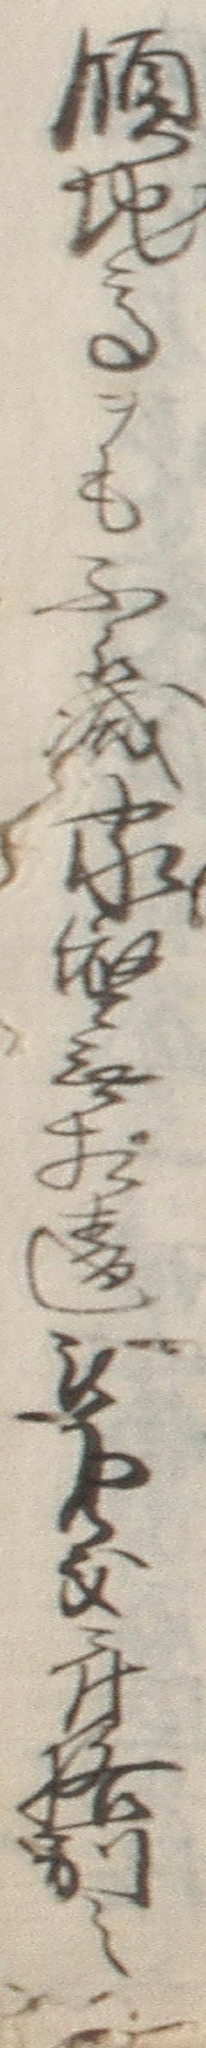領地高ヲも不被減家督無相違被下候義ニ付格別之

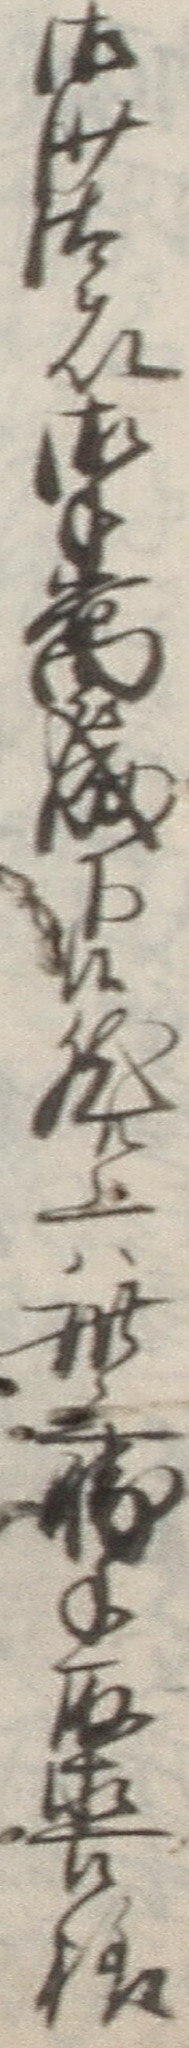御沙汰ヲ以御手当被成下候然ル上ハ此上勝手取直候様
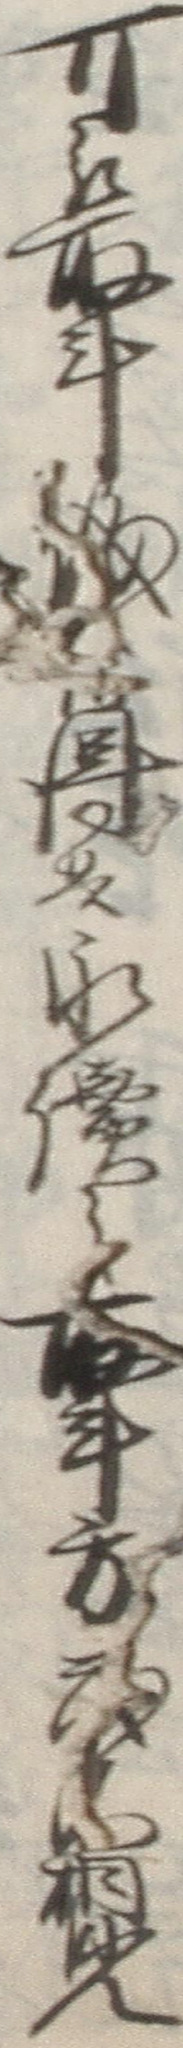可被取義二候得共永價の取斗方も不相見
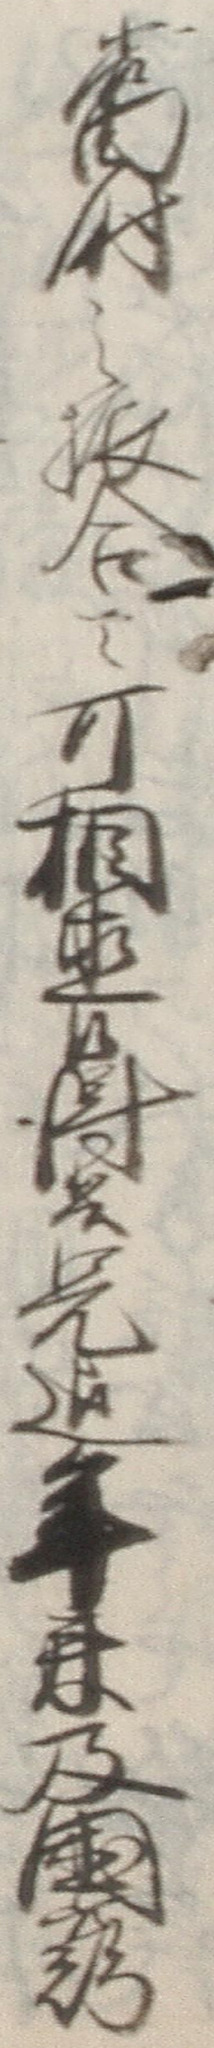当時の振合は可相直候得共是迄年来及困窮
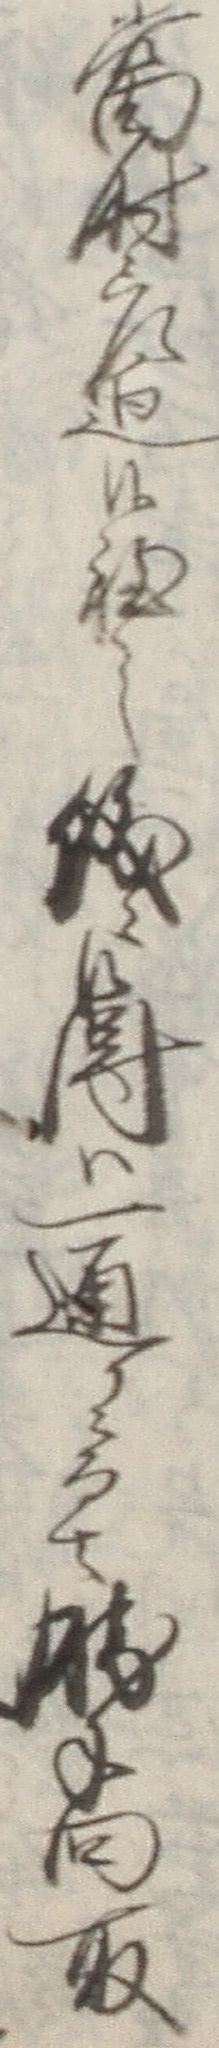当時差迫候程之儀ニ候得ハ一通りニ而は勝手向取
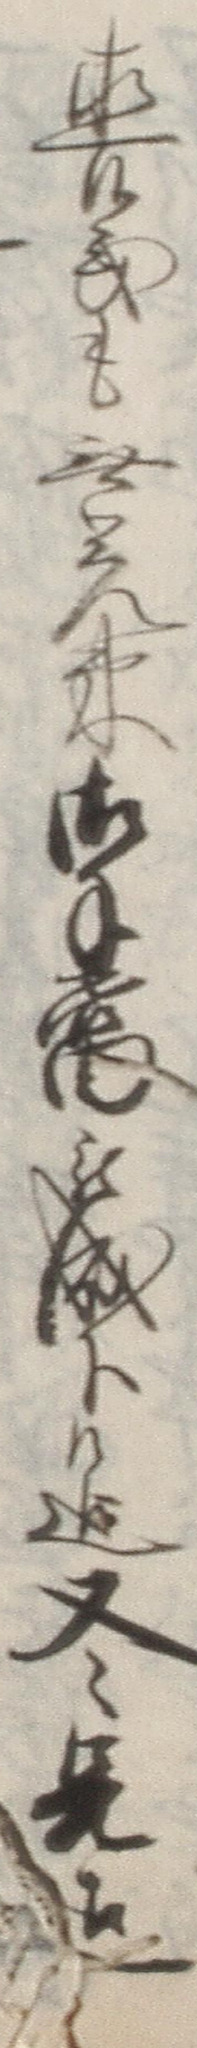直候義も無覚束御手当被成下候迄又々是迄
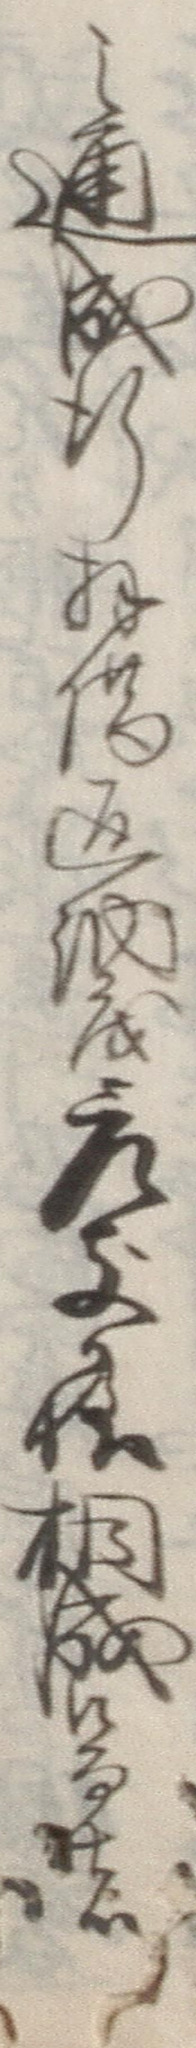の通成行拝借返納も差支候儀相成候而は
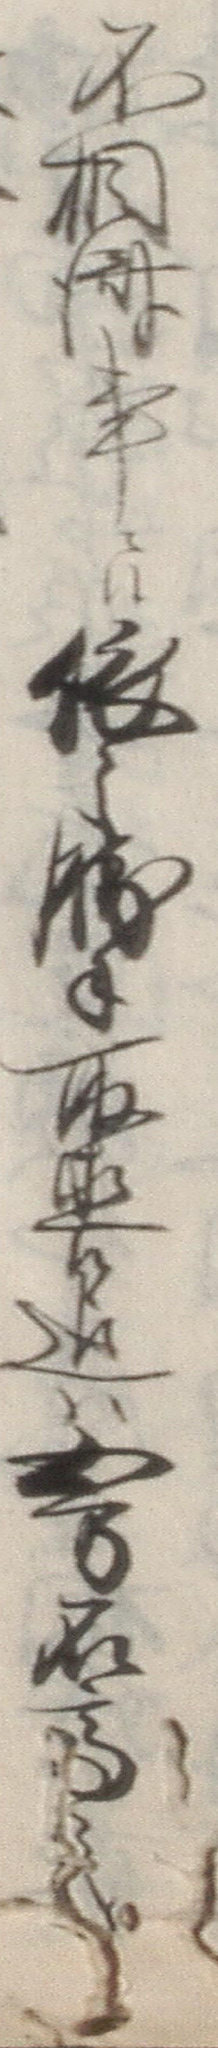不相済事ニ候依之勝手取直候迄ハ五万石高
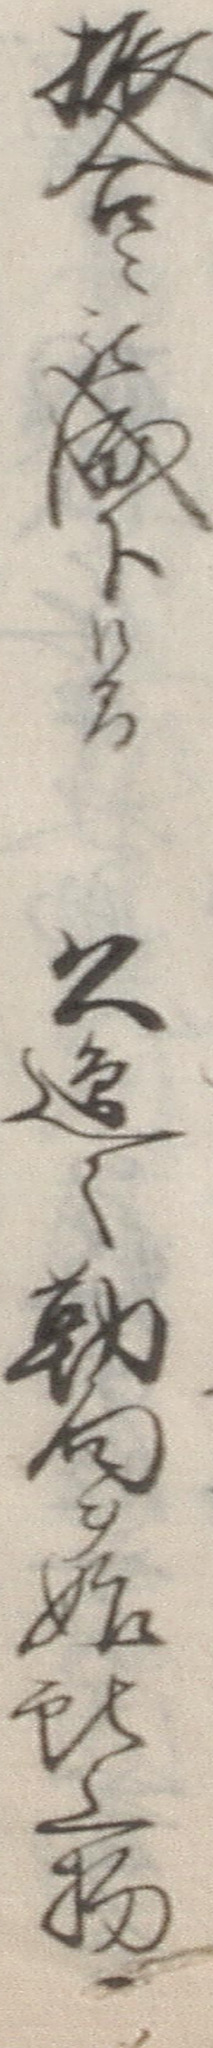振合ニ被成下候間公辺之勤向ヲ始献上物
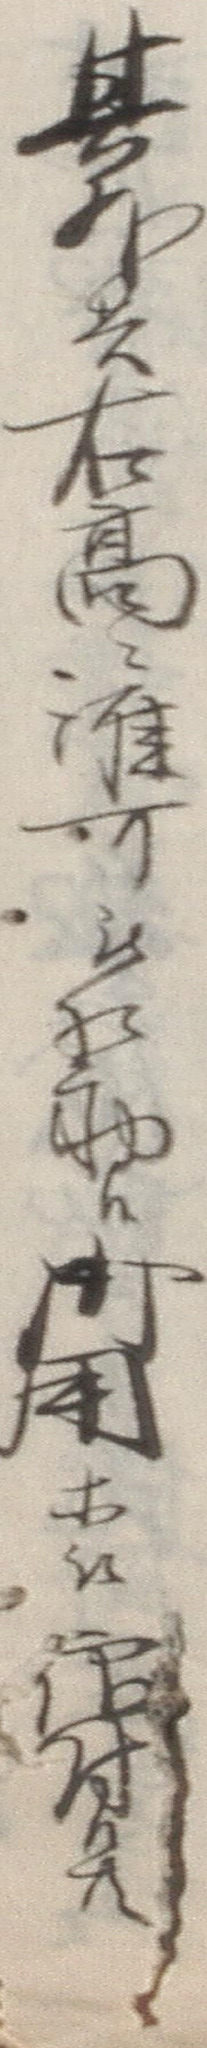其外共右高ニ准可被相納候御用等被仰付候共
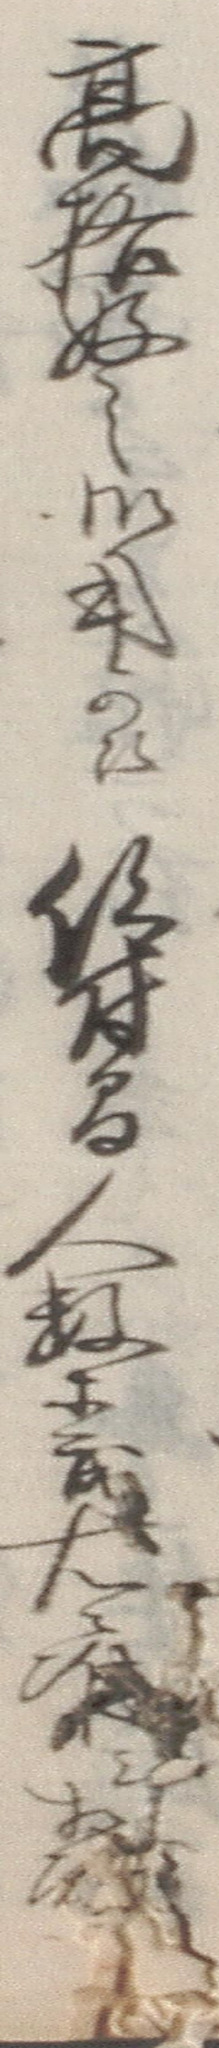高格好之御用可被仰付間人数等も右ニ准相願
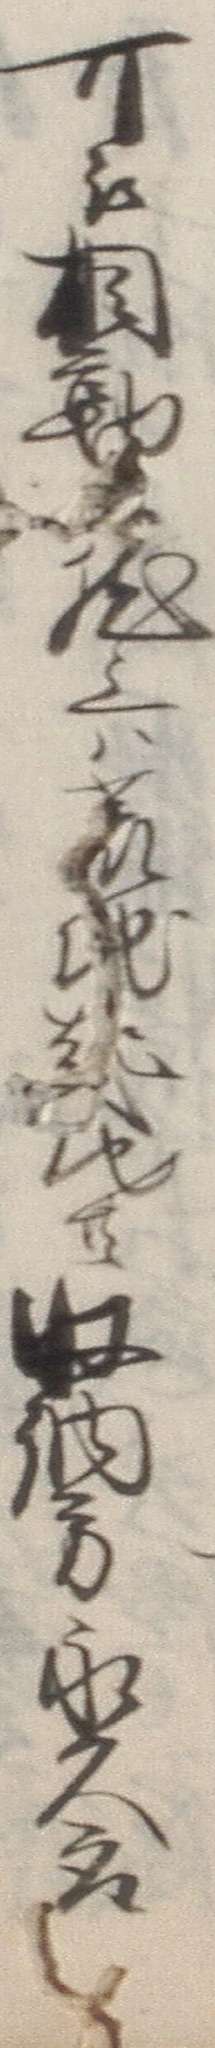可被相勤候然上ハ荒地起返地共収納方永久取
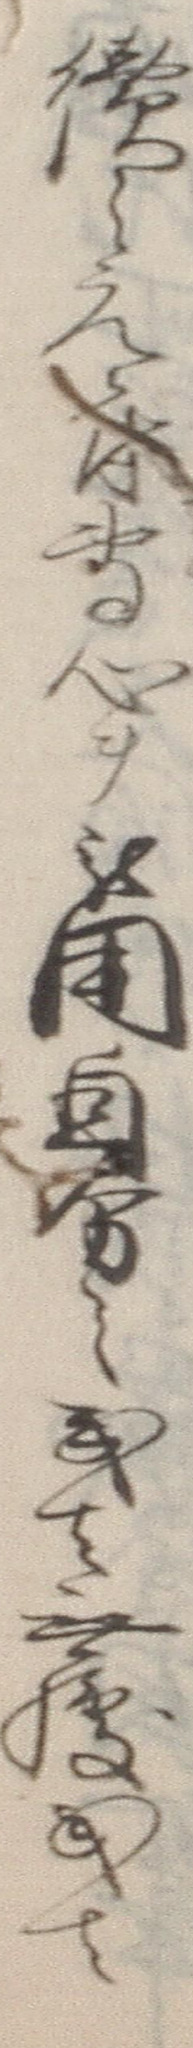続之元ニ付専心ヲ被用自分之義は無拠義は
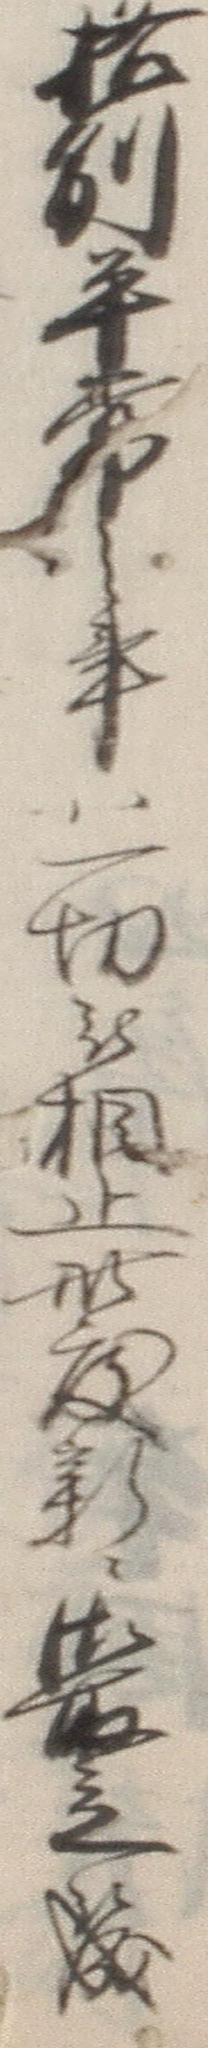格別平常之事ハ一切被相止此度新ニ御取立被成
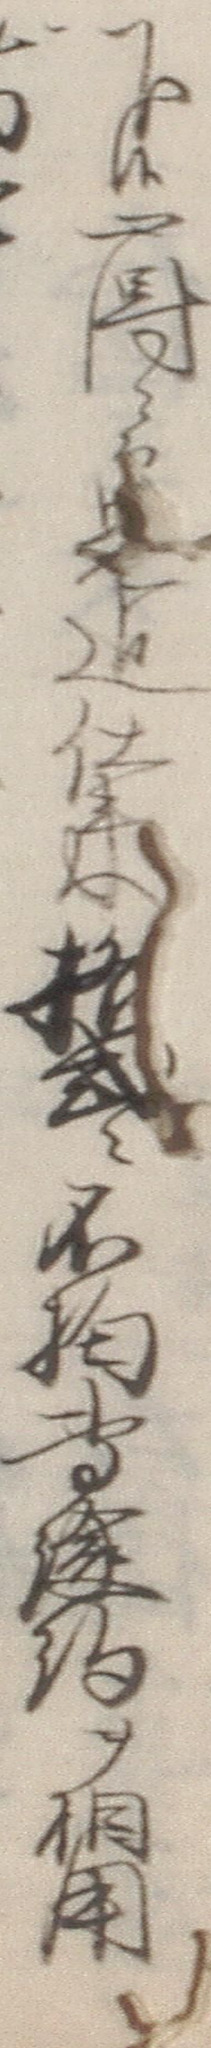下候心得ニ而是迄仕来格式二不拘専倹約ヲ相用
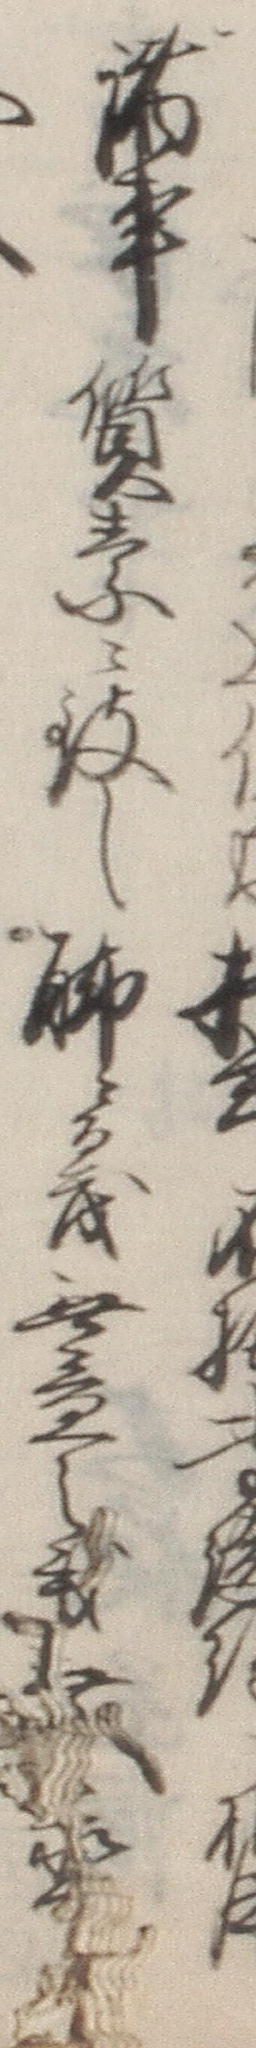諸事質素ニ致し聊ニ而も無益の義無
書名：[諸国災害記録]
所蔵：東京大学地震研究所図書室 Earthquake Research Institute Library, The University of Tokyo, JAPAN
